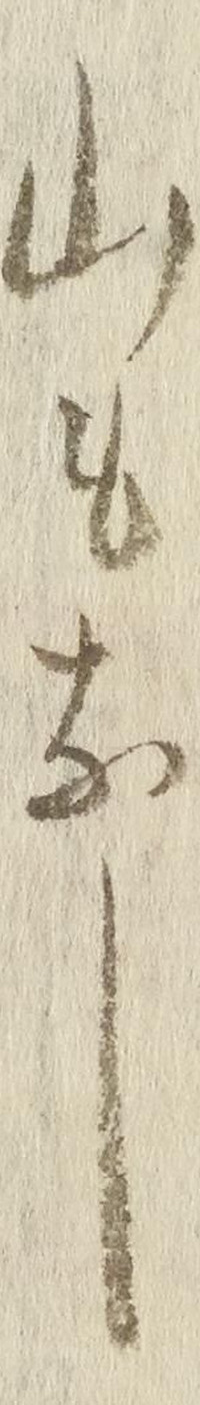山もなし
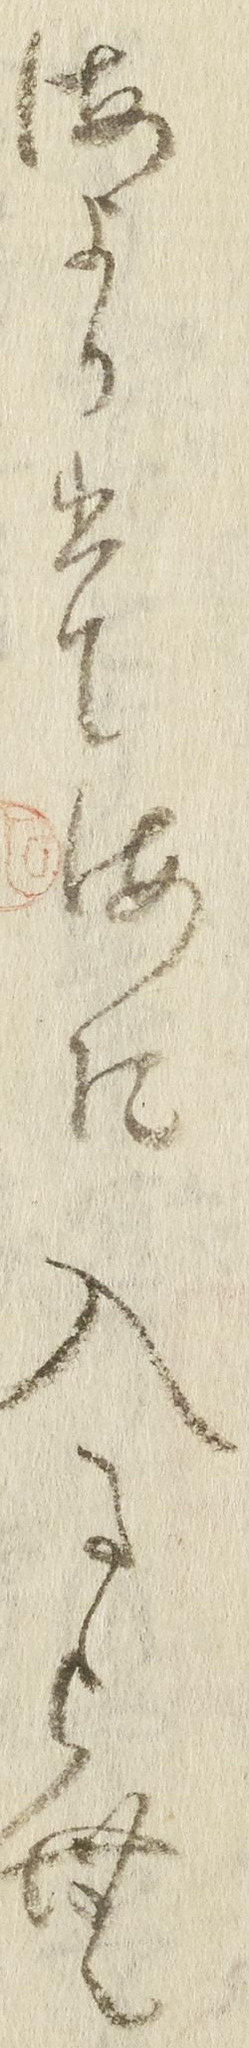海より出て海に入るらむ
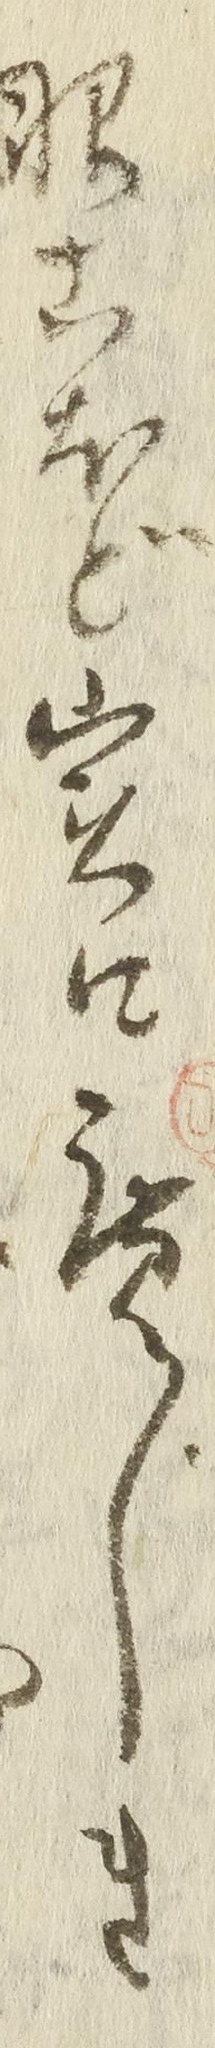眼こほど実に広〴〵き
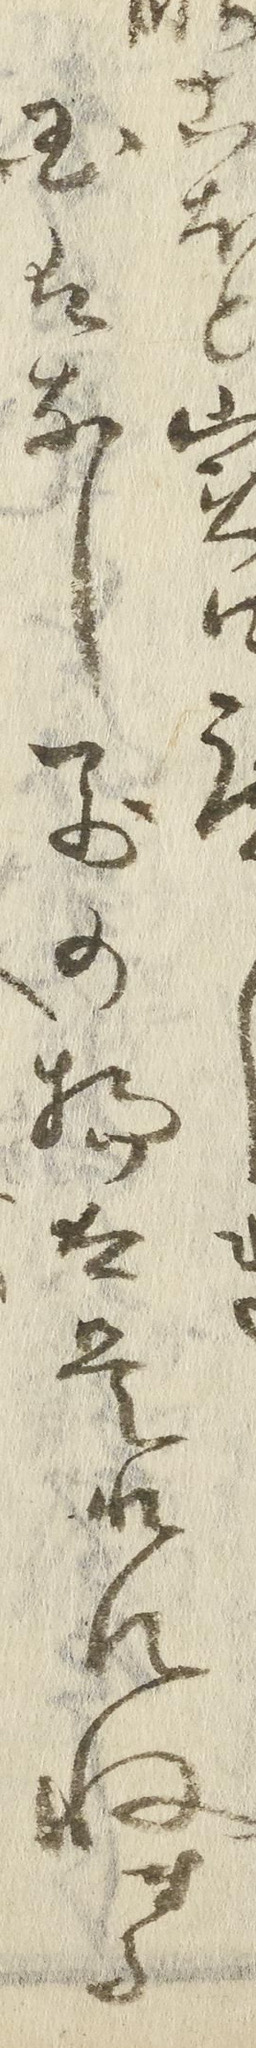国はなし萬の物は是れに収まる
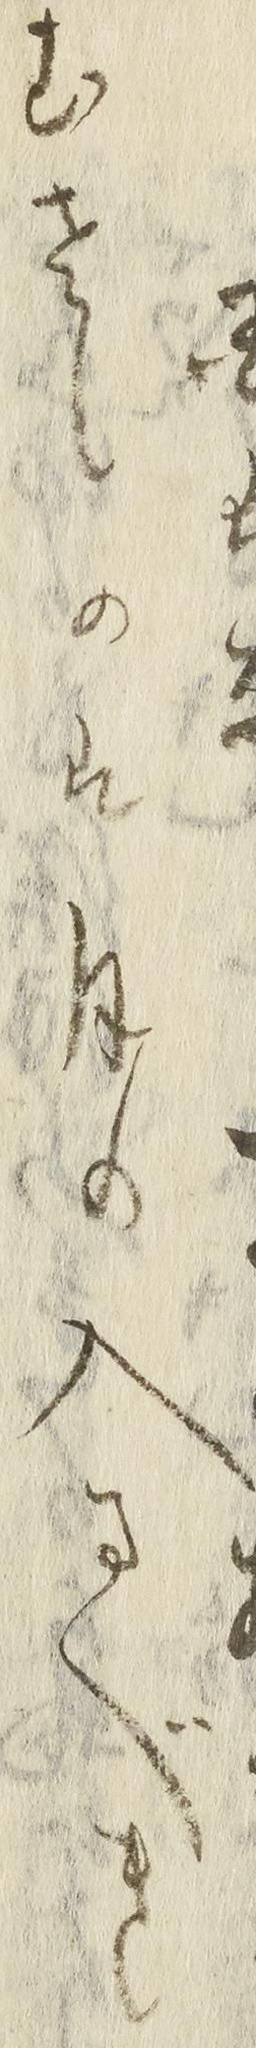むさしのは月の入るべき
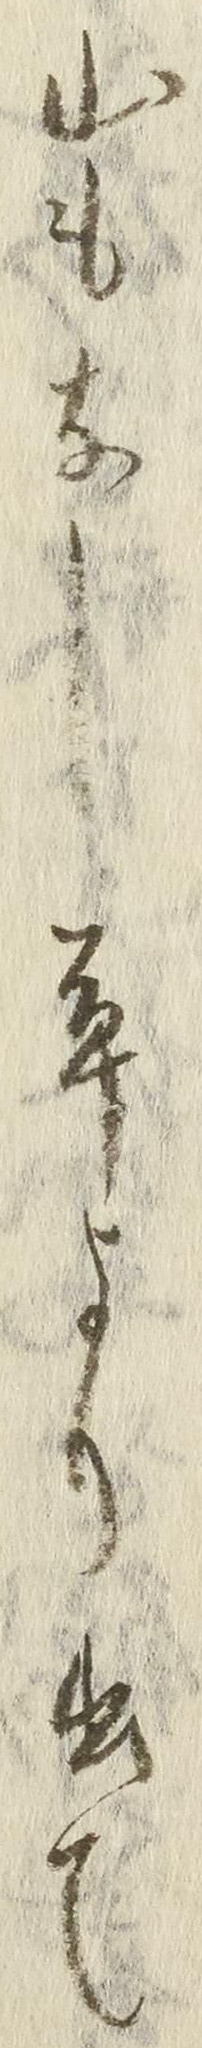山もなし草より出て
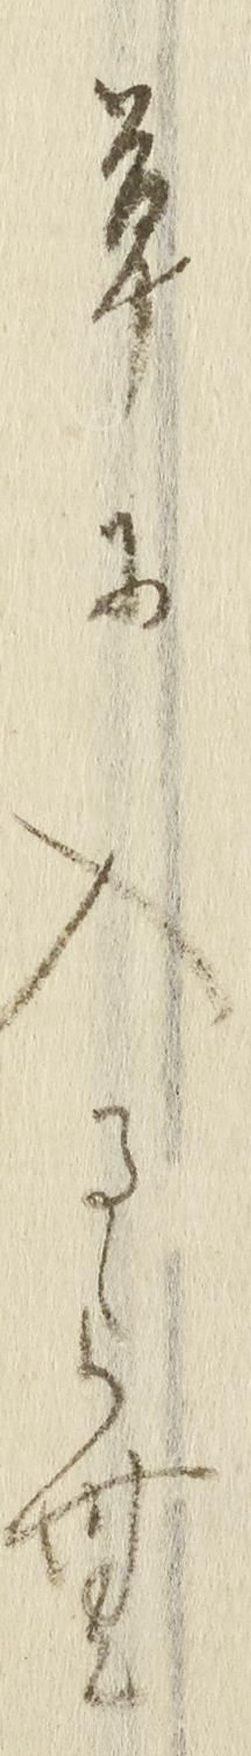草に入るらむ
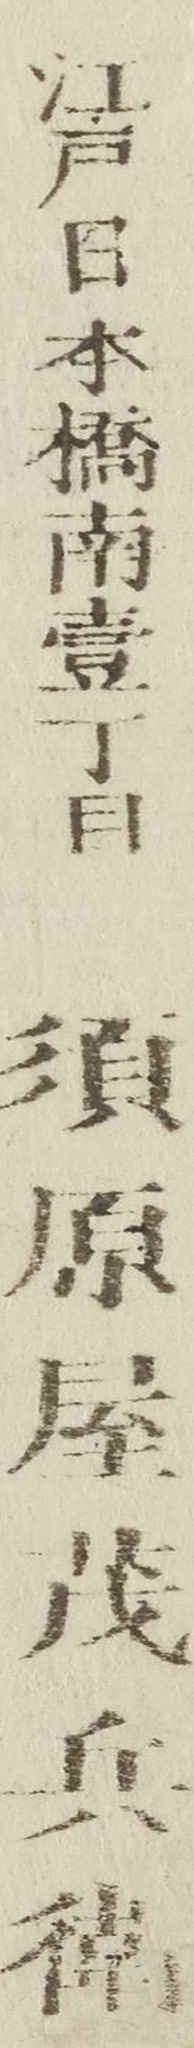江戸日本橋南壱丁目須原屋茂兵衛
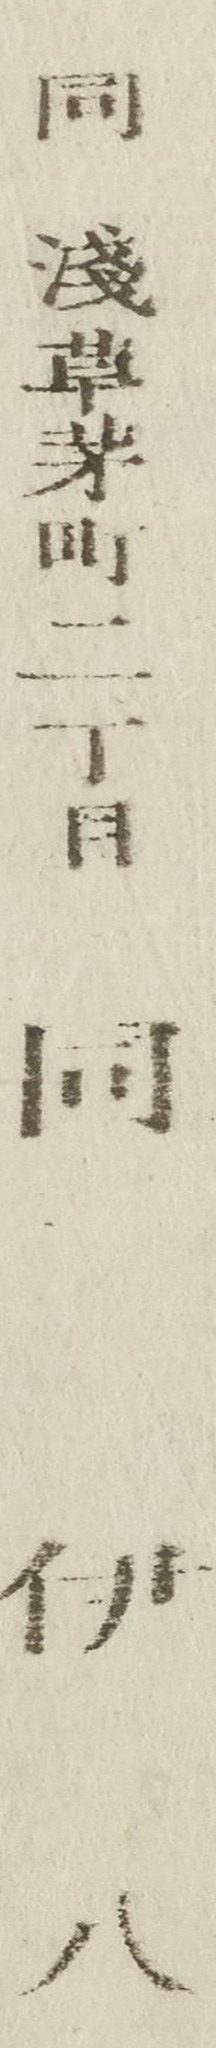同浅草茅町二丁目同伊八
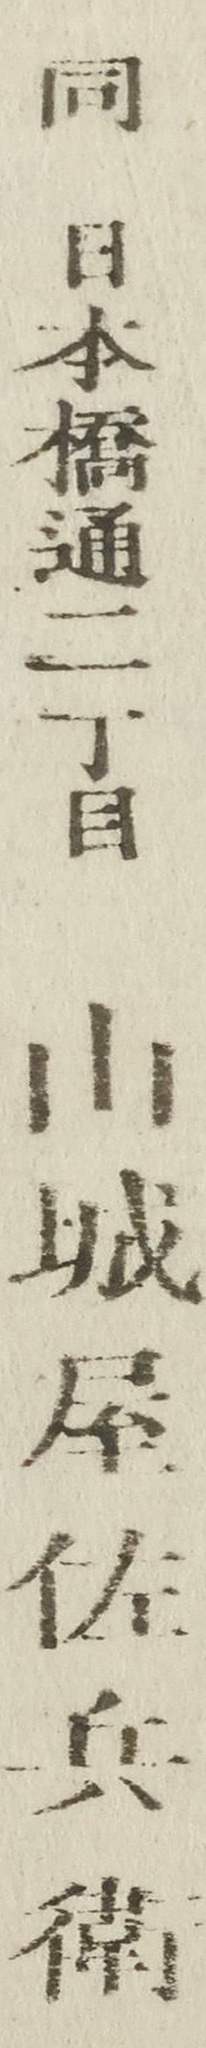同日本橋通二丁目山城屋佐兵衛
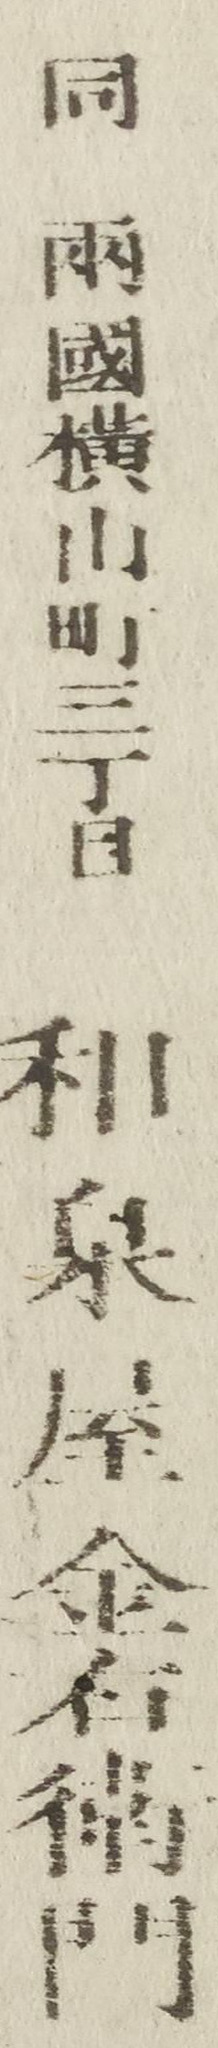同両国横山町三丁目和泉屋金右衛門
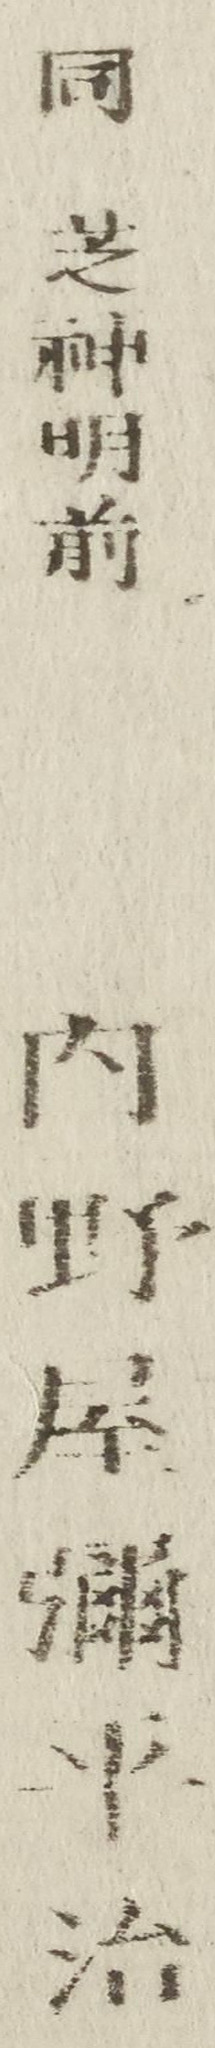同芝神明前内野屋弥平治
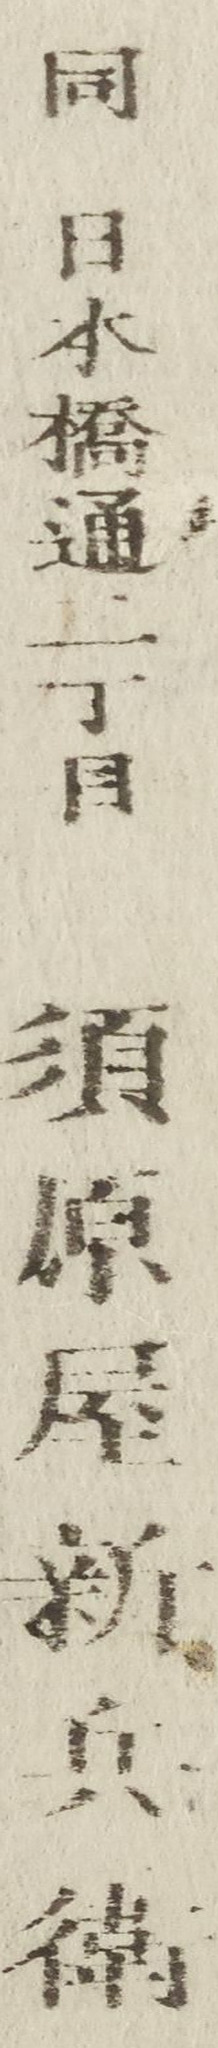同日本橋通一丁目須原屋新兵衛
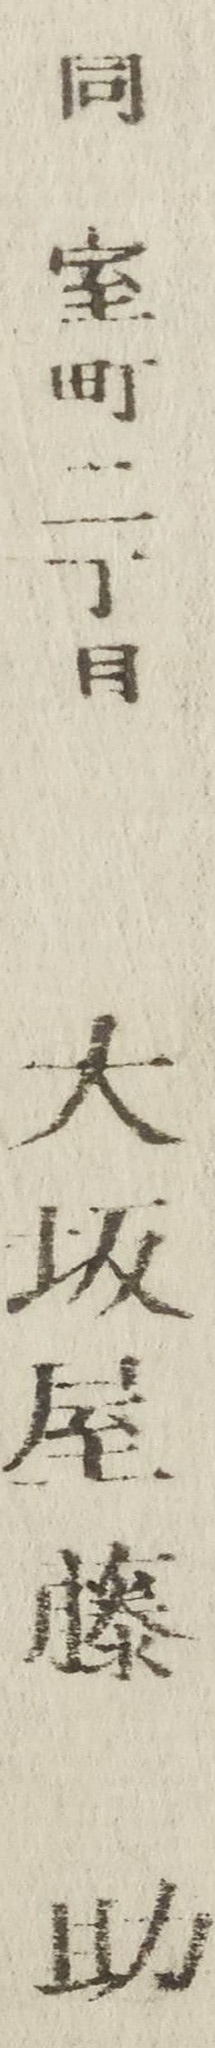同室町二丁目大坂屋藤助
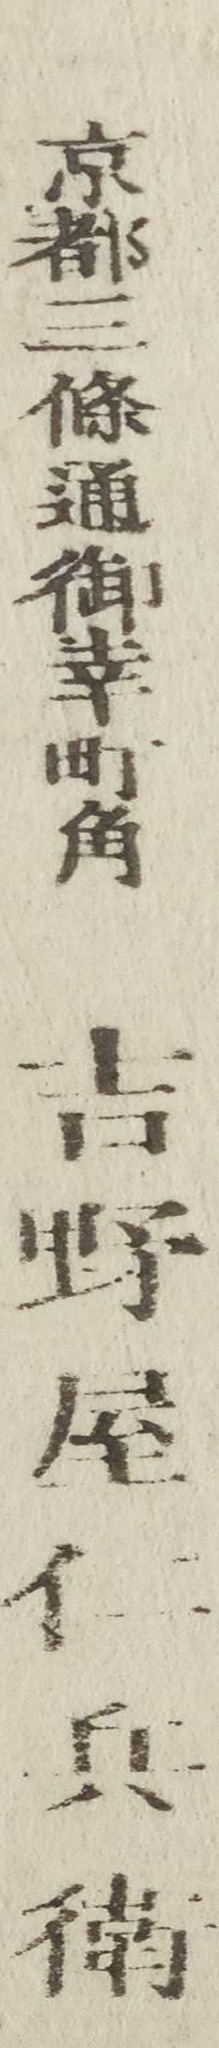書肆京都三條通御幸町角吉野屋仁兵衛
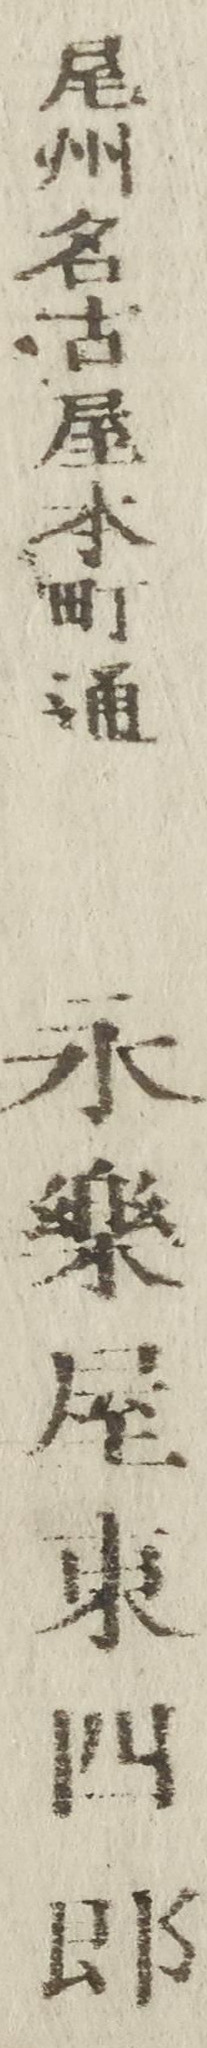尾州名古屋本町通永楽屋東四郎
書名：天地或問珍　地
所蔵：東京大学地震研究所図書室 Earthquake Research Institute Library, The University of Tokyo, JAPAN
